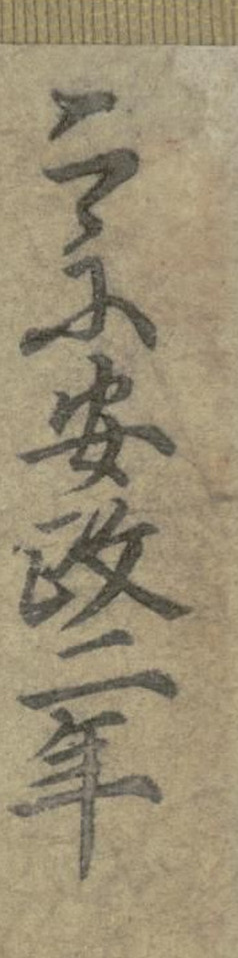こゝに安政二年
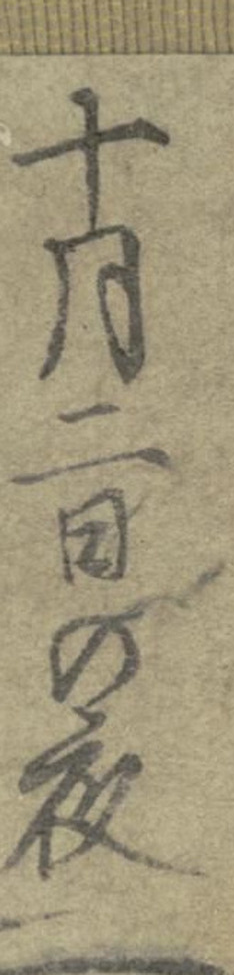十月二日の夜
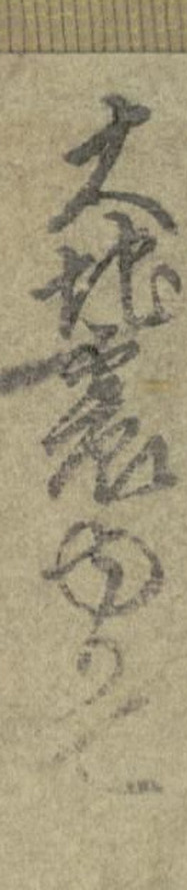大地震ゆりて
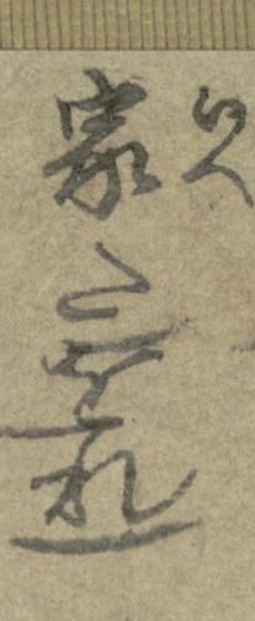家たをれ
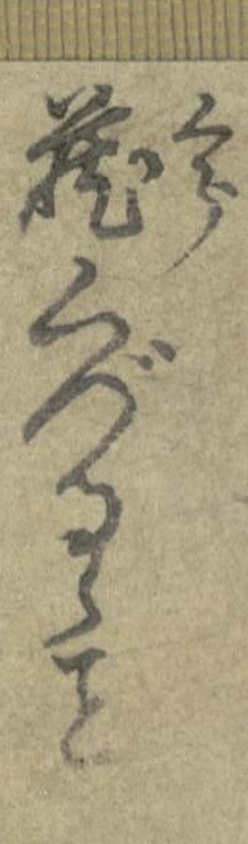蔵くづるゝこと
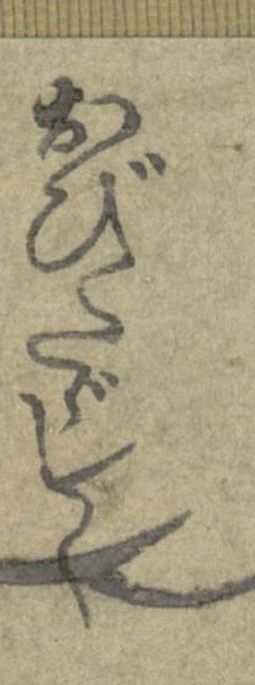おびたゞしく
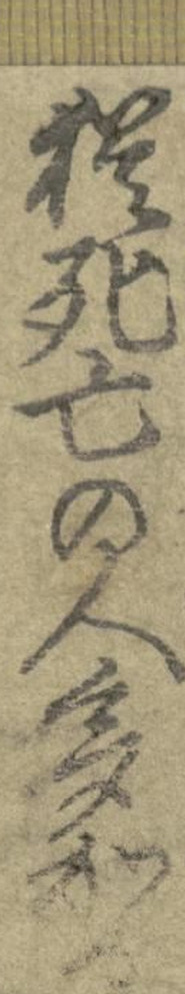猶死亡の人多かる
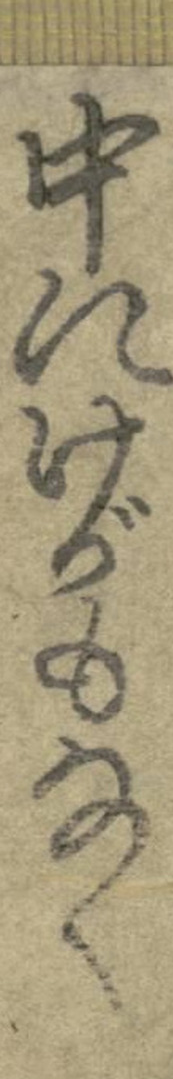中にけがもなく
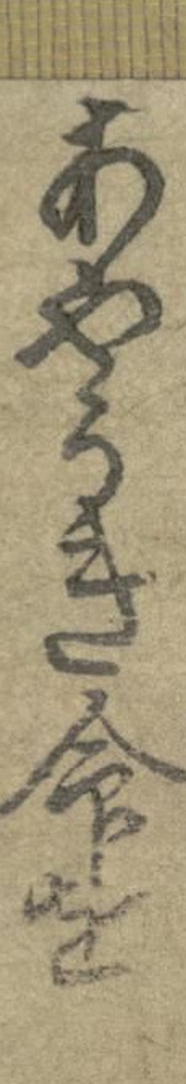あやうき命を
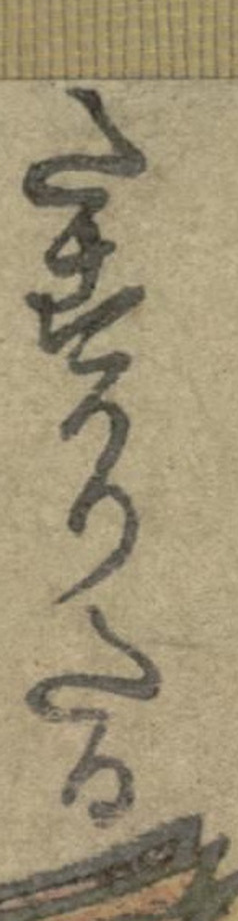たすかりたる
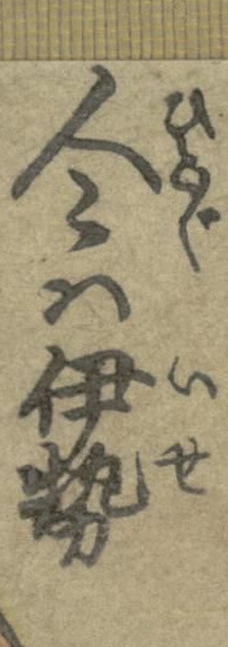人〻は伊勢
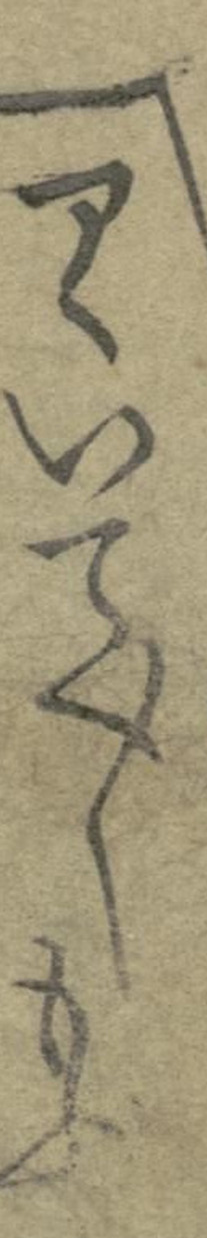〽アヽいてへ〳〵もふ
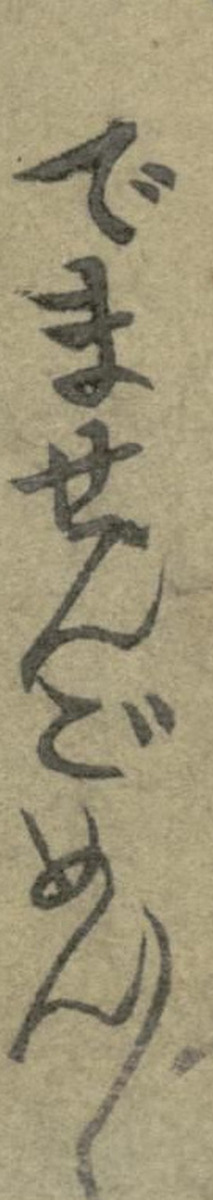でませんごめん〳〵
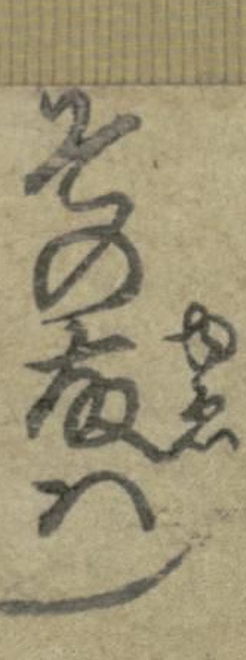その故は
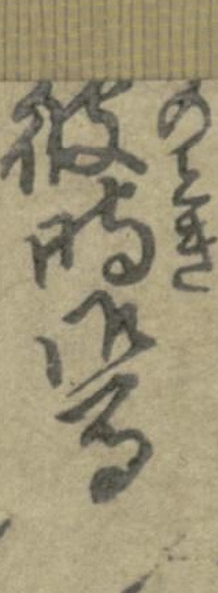彼時御馬
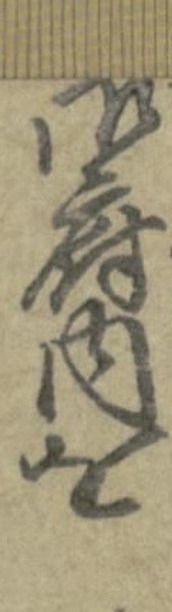御府内を
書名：[伊勢の馬を引く鹿島大明神]
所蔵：東京大学地震研究所図書室 Earthquake Research Institute Library, The University of Tokyo, JAPAN
